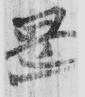是
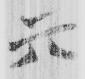亓
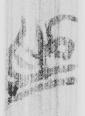爲
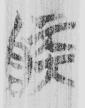疾
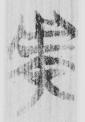央
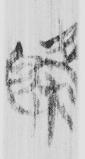{既火}
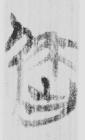屈
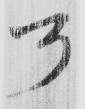乃
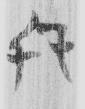夂
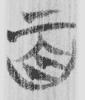百
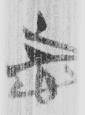志
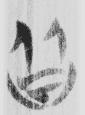皆
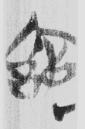{宮身}
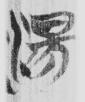湯
